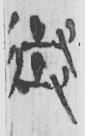{彳土又土又}
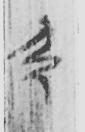弓
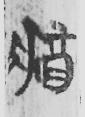𨟻（將）
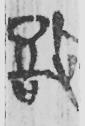{豆口攴}
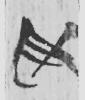爲
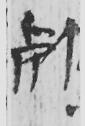死
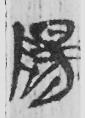陽
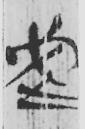武
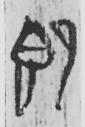即
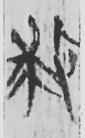救
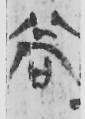尚
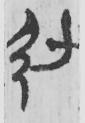引
